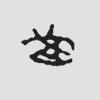武
